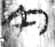午
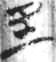坐
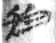於
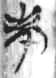未
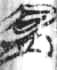盍（蓋）
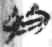於
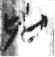申
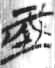城（成）
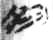於
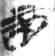梄（酉）
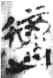○（復）
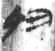於
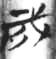戌
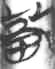○（怨）
